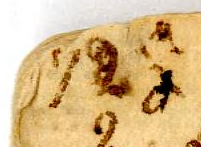72
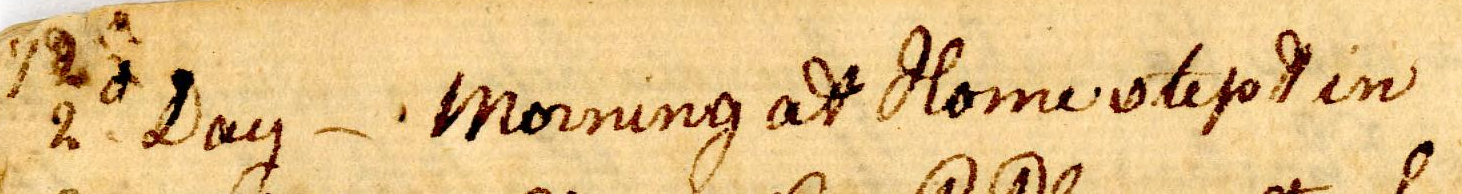2^d Day- Morning at Home stept in
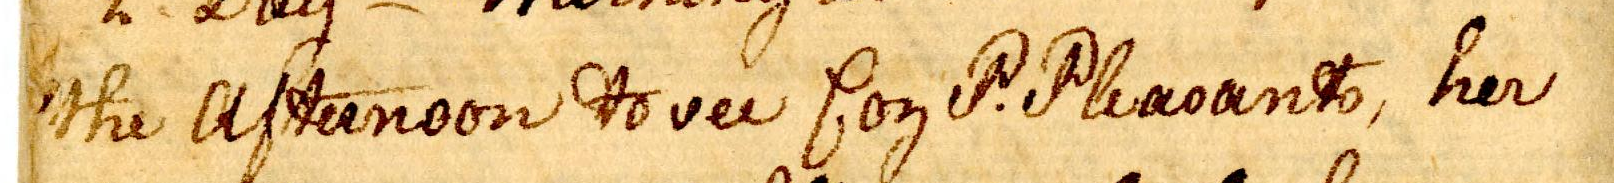the Afternoon to see Coz P. Pleasants, her
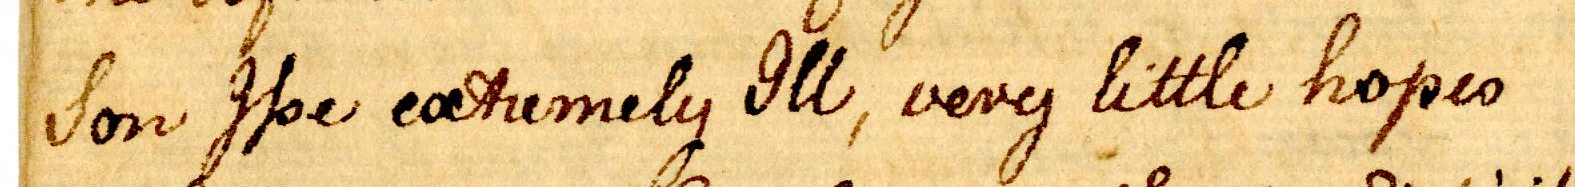Son Jsse extremely Ill, very little hopes
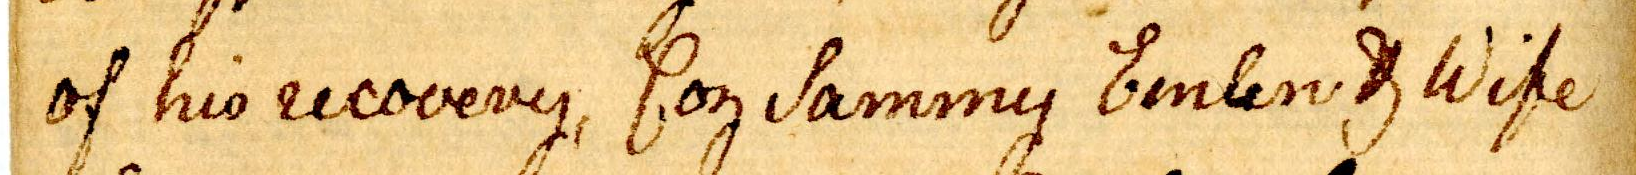of his recovery, Coz Sammy Emlen & Wife
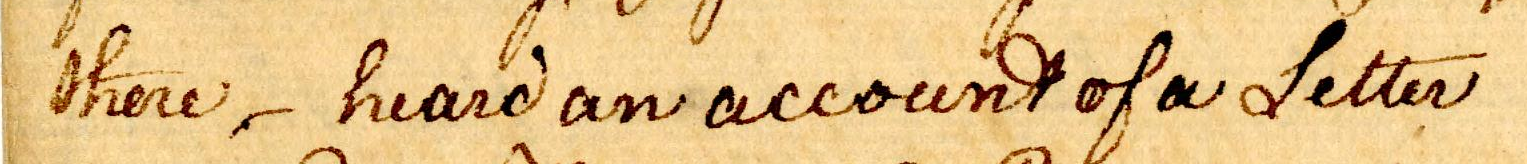there- heard an account of a Letter
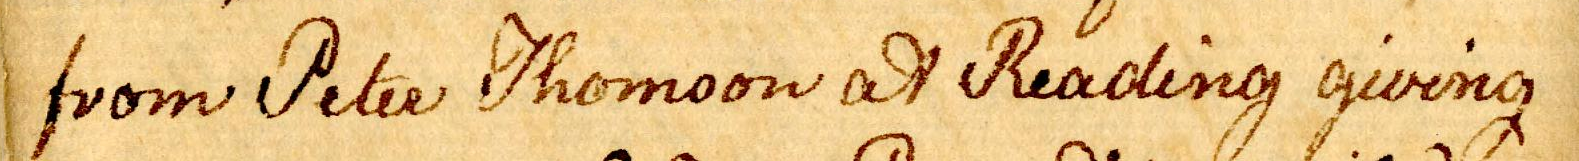from Peter Thomson at Reading giving
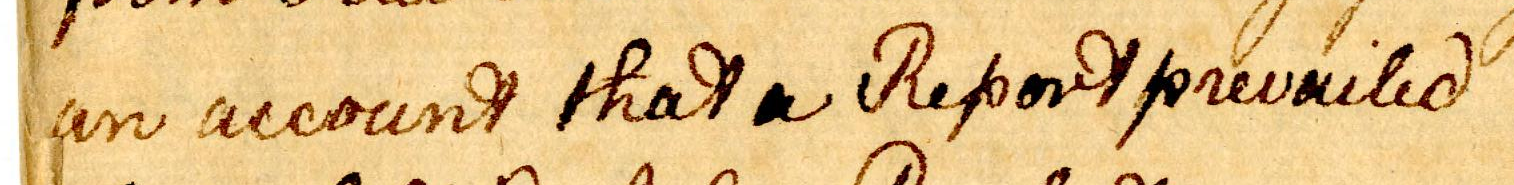an account that a Report prevailed
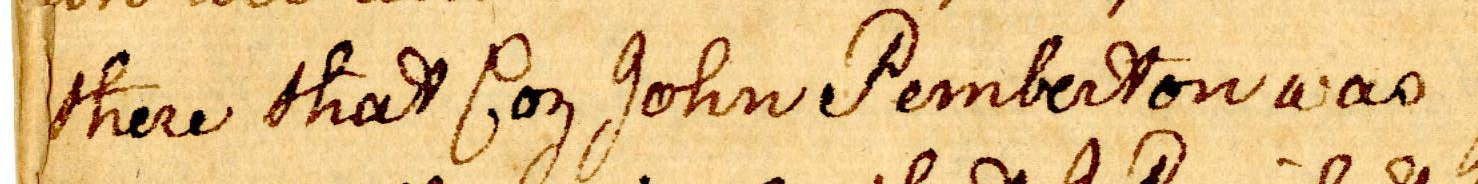there that Coz John Pemberton was
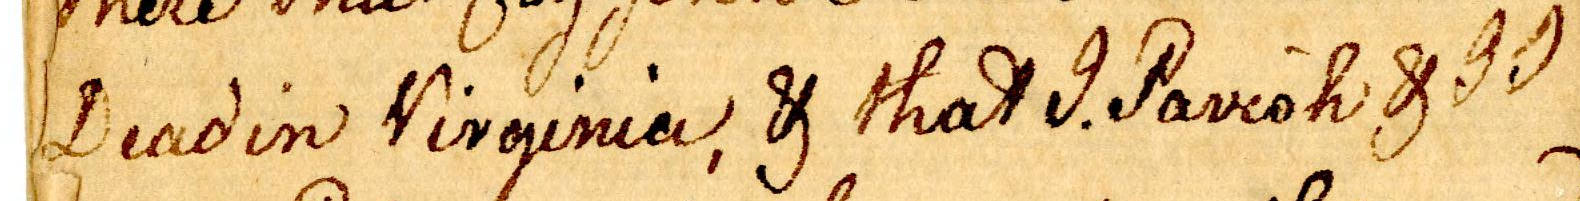Dead in Virginia & that I. Parish & JJ
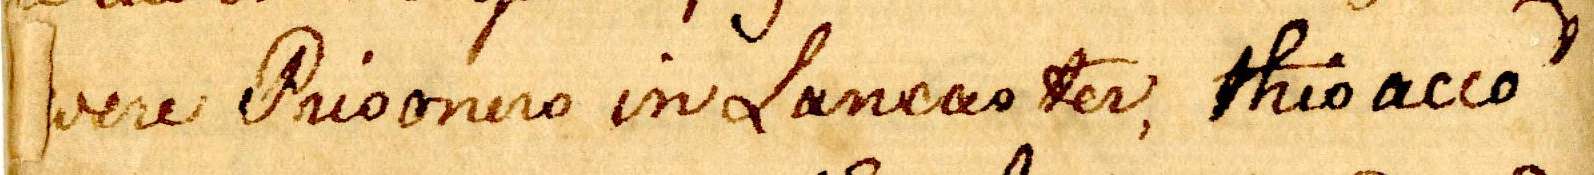were Prisoners in Lancaster, this acco^t
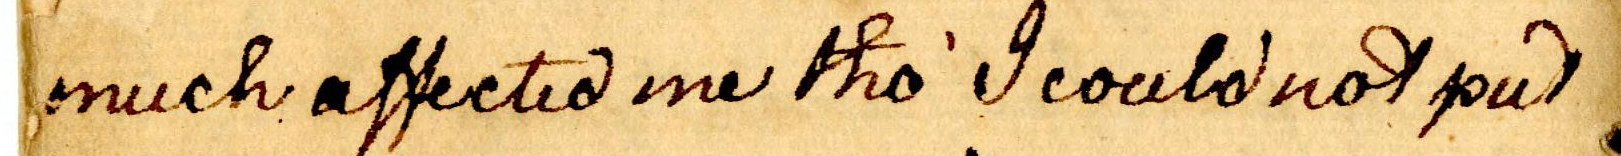much affected me tho' I could not put
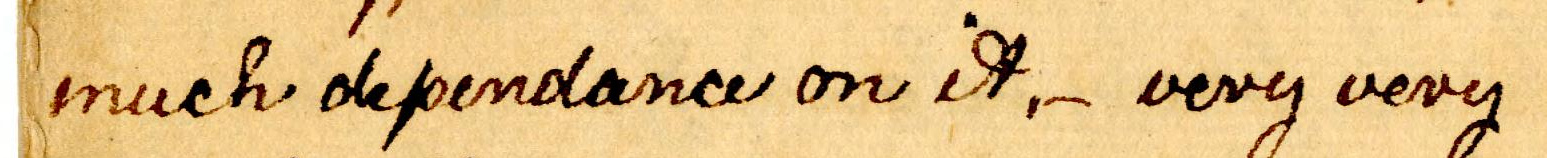much dependance on it,- very very
